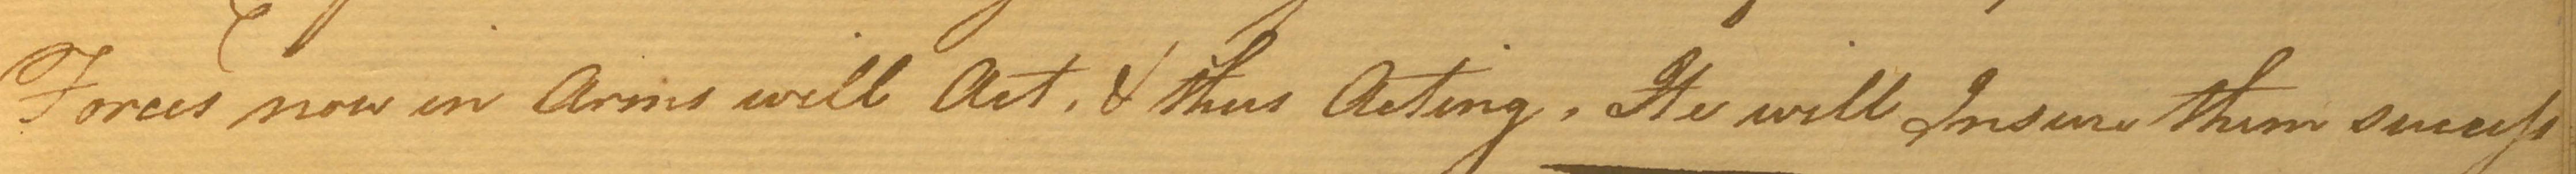Forces now in Arms will Act, & thus Acting, He will Insure them success
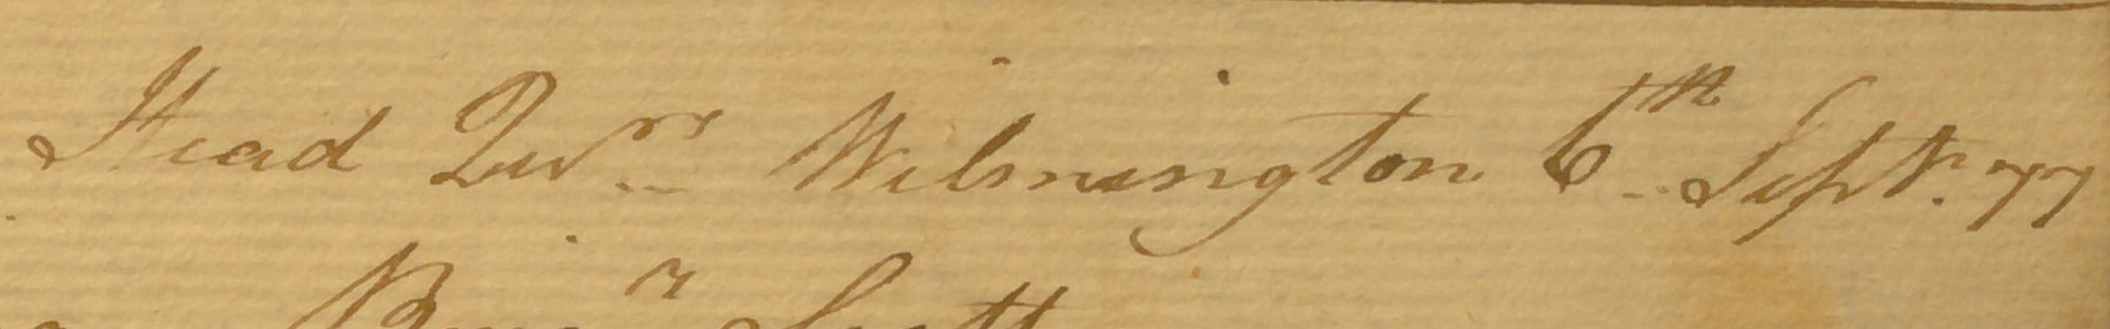Head Qu^rs. Wilmington 6^th. Sept^r. 77
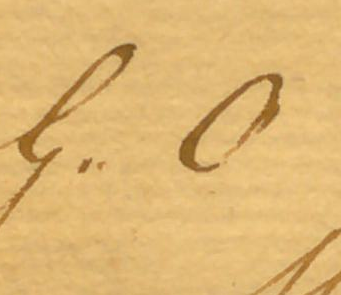G.O
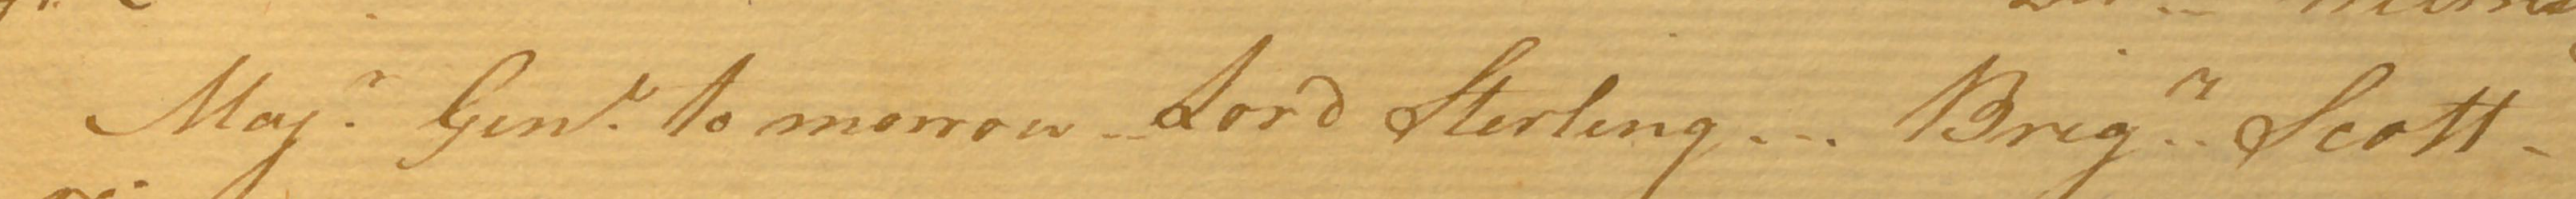Maj^r. Gen^l. to morrow Lord Sterling .. Brig^r. Scott.
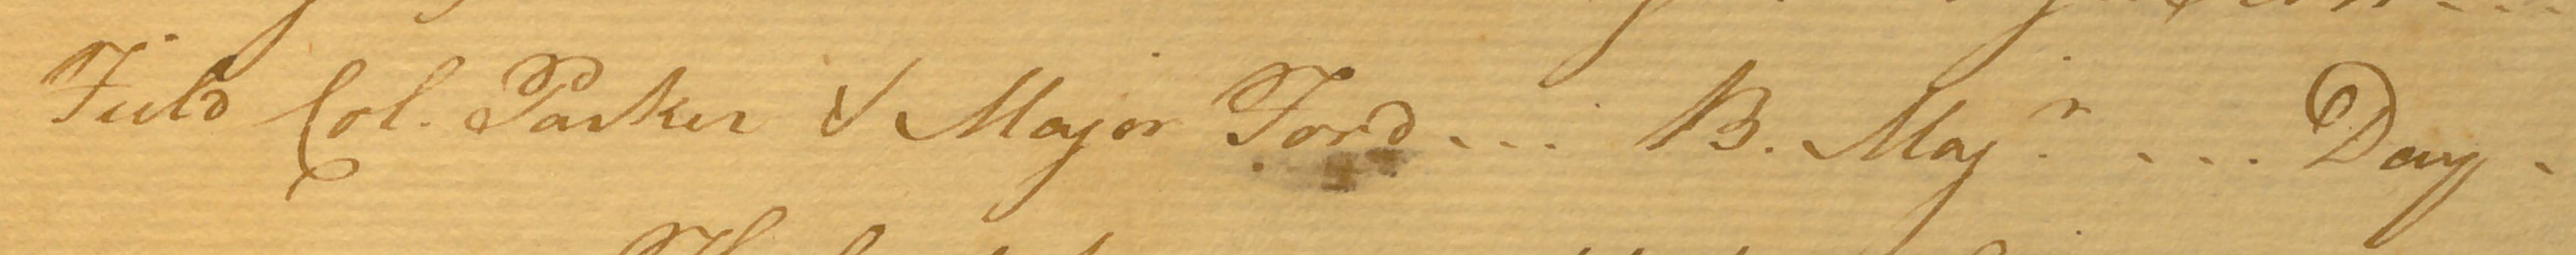Field Col. Parker & Major Ford... B. Maj^r. ... Day..
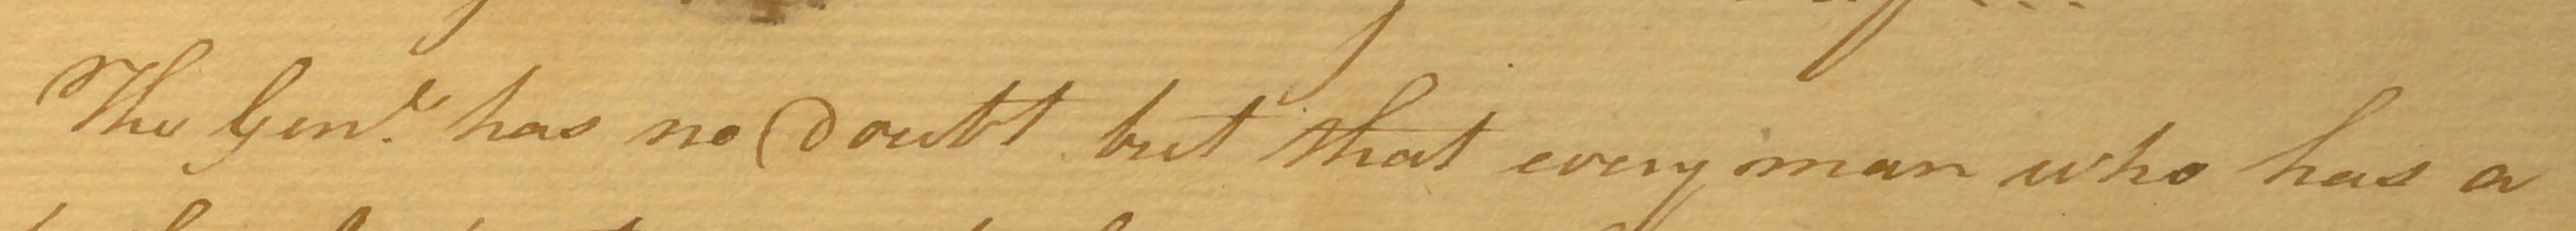The Gen^l. has no doubt but that every man who has a
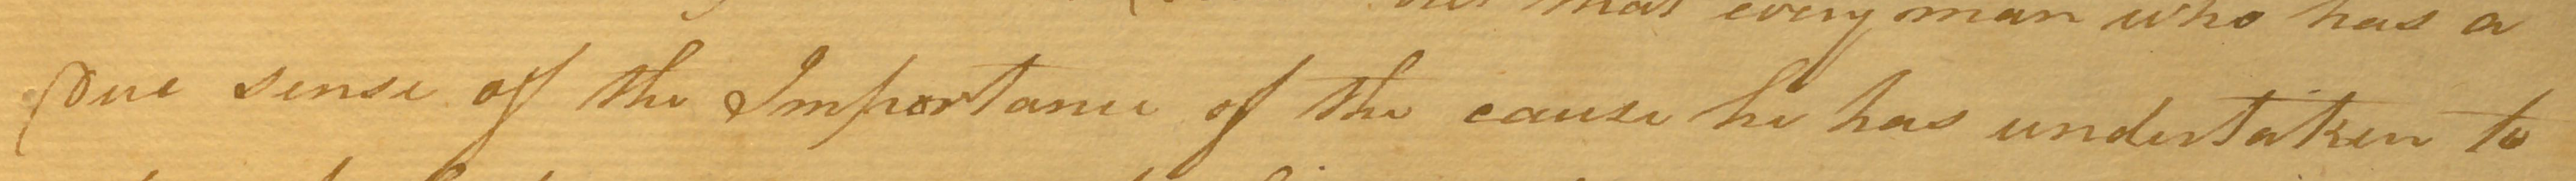due sense of the Importance of the cause he has undertaken to
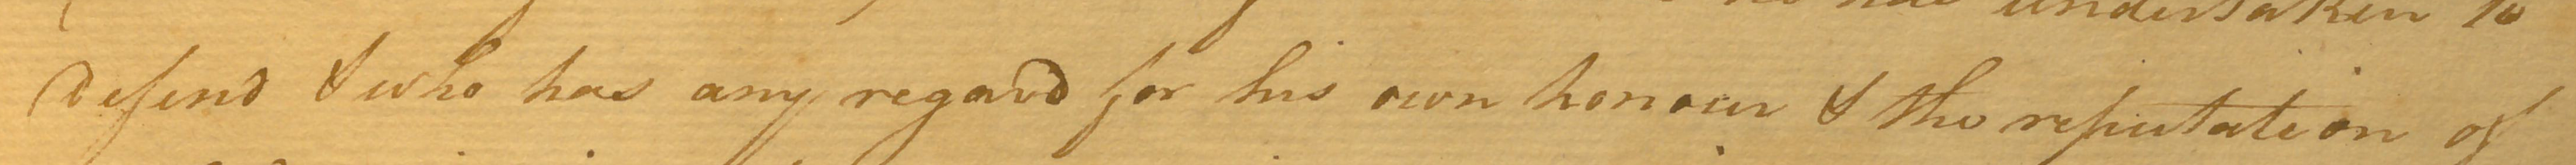defend & who has any regard for his own honour & the reputation of
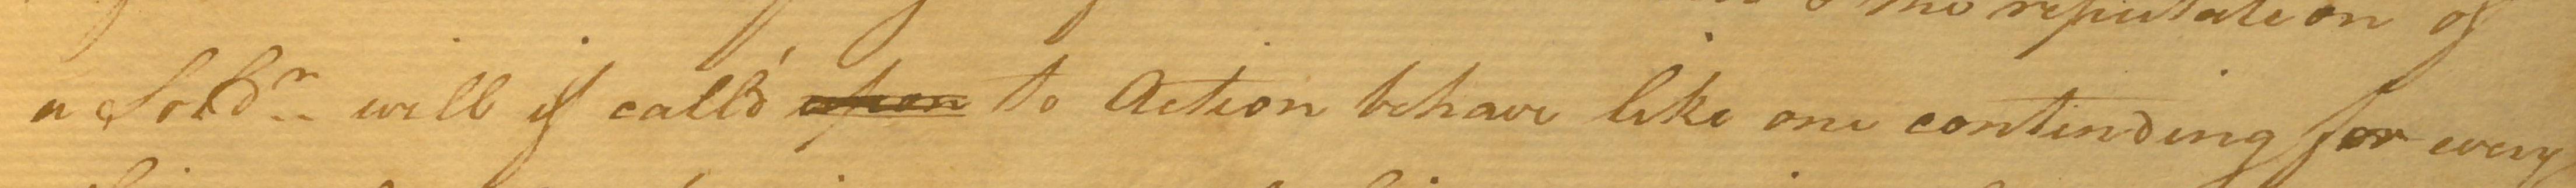a Sold^r. will if call'd [____] to Action behave like one contending for every
